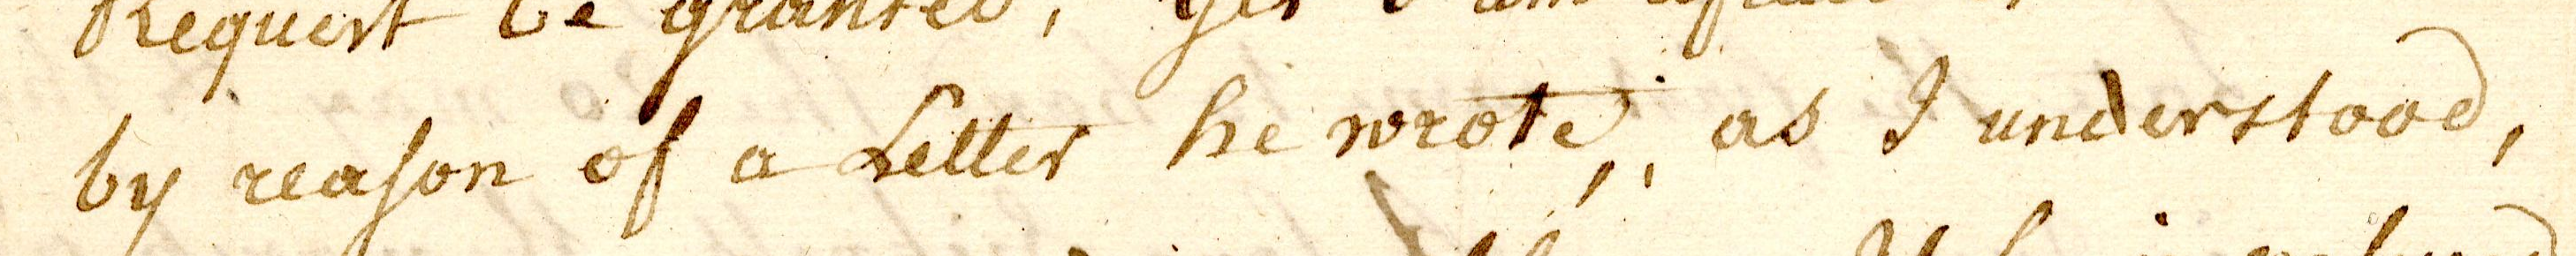by reason of a Letter he wrote, as I understood,
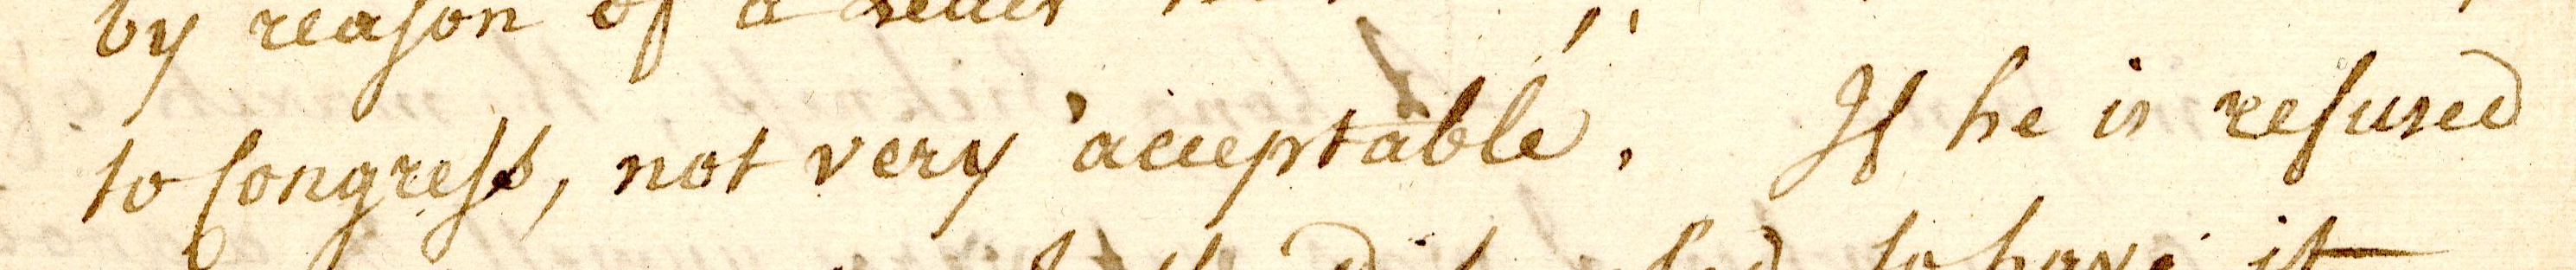to Congress, not very acceptable. If he is refused
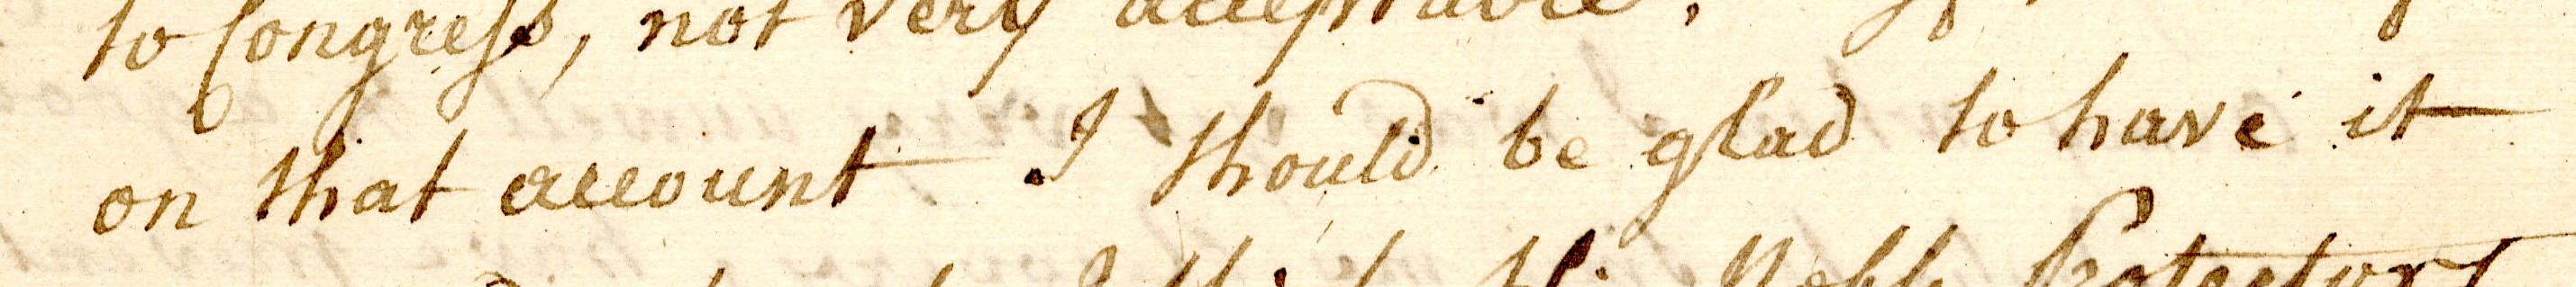on that account I should be glad to have it
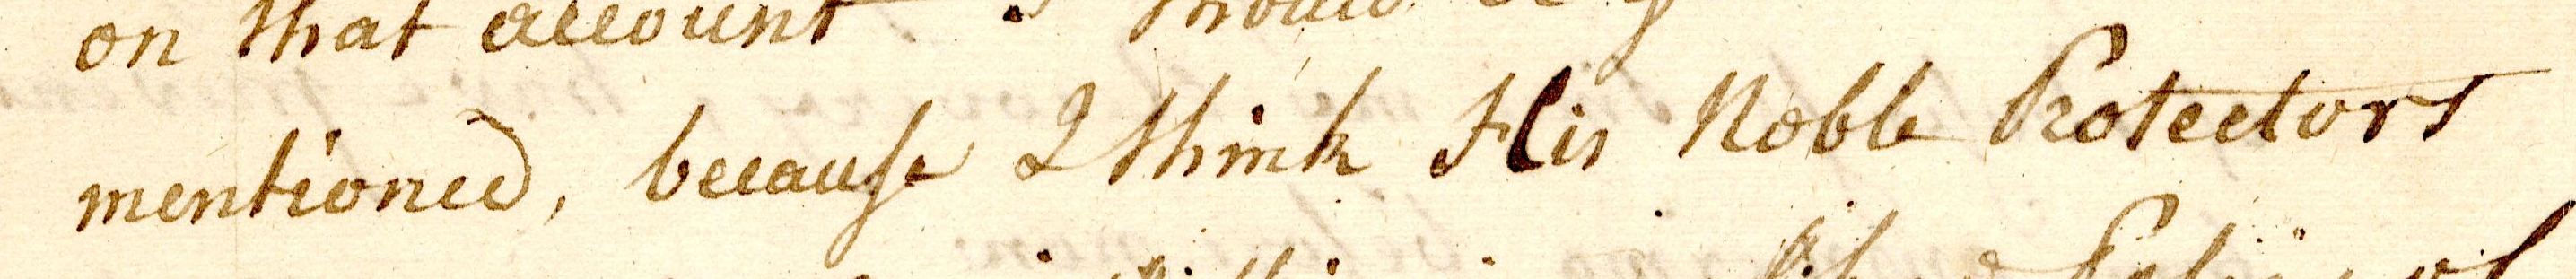mentioned, because I think His Noble Protectors
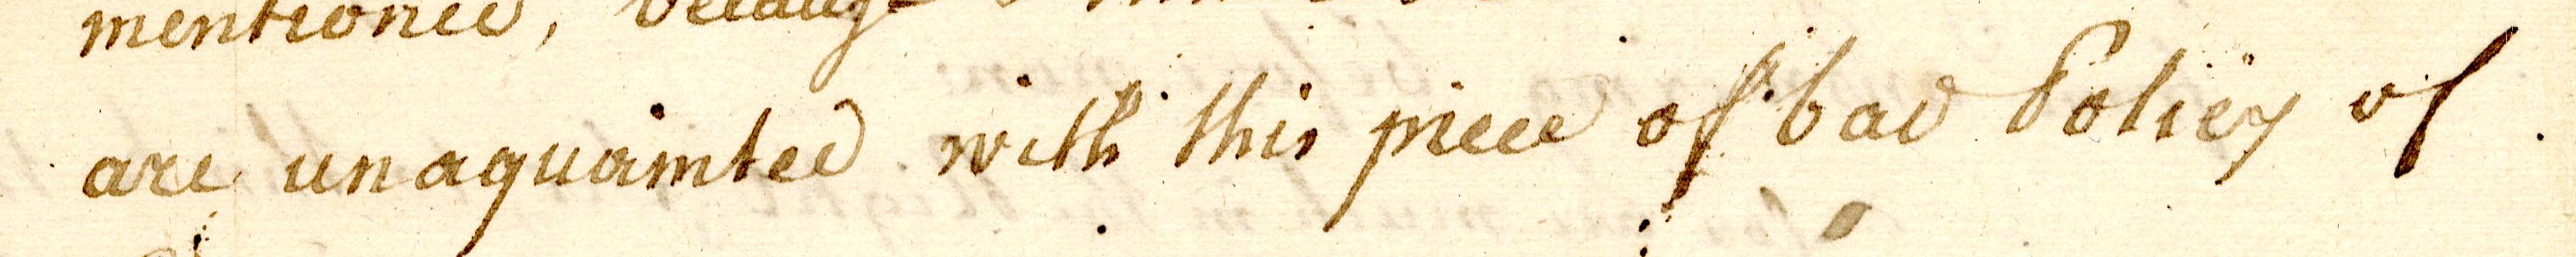are unaquainted with this piece of bad Policy of
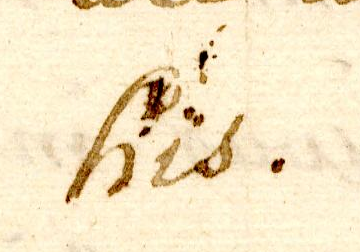his.
